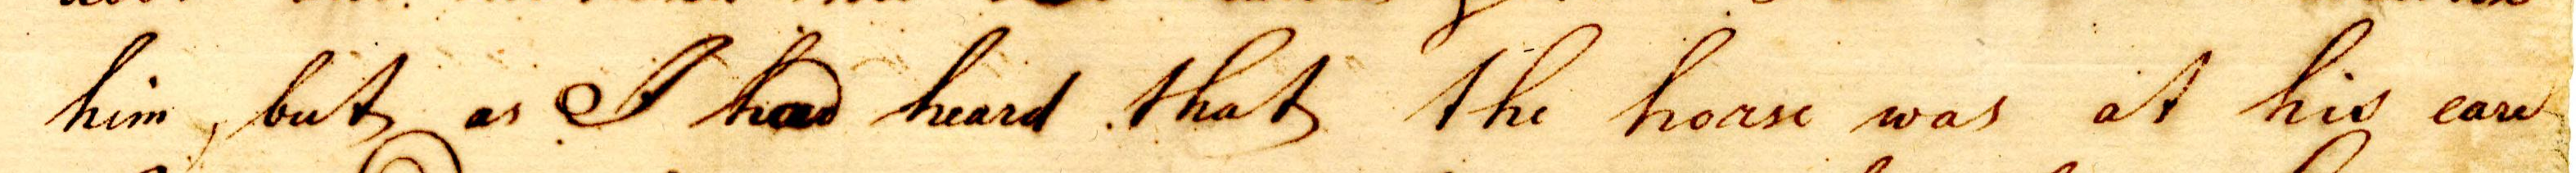him, but as I had heard that the horse was at his care
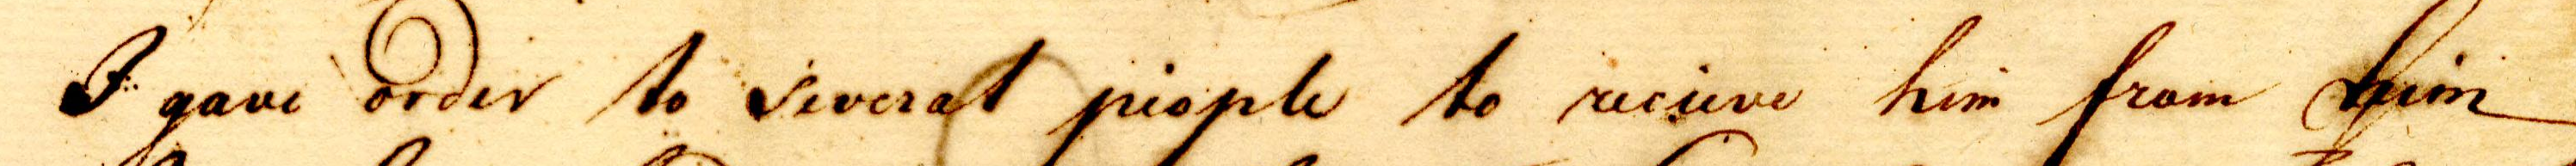I gave order to several people to recieve him from him
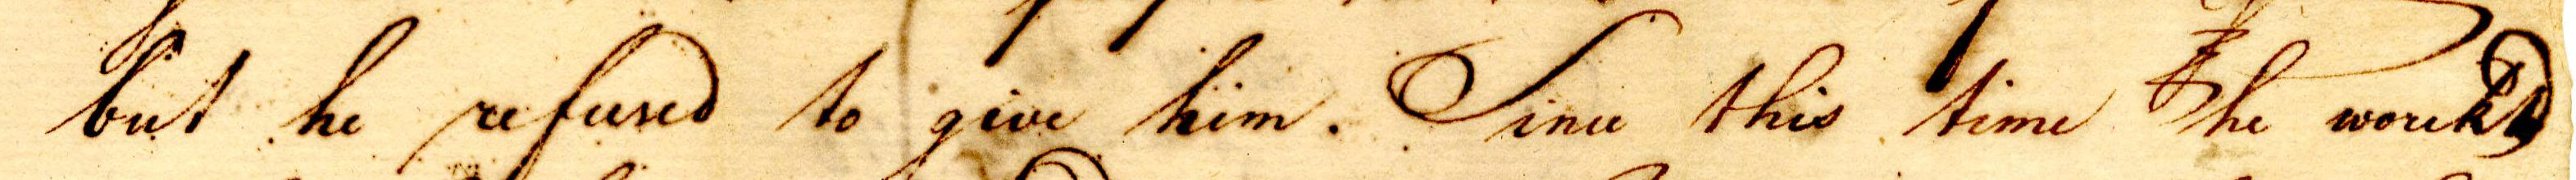but he refused to give him. Since this Time he work'd
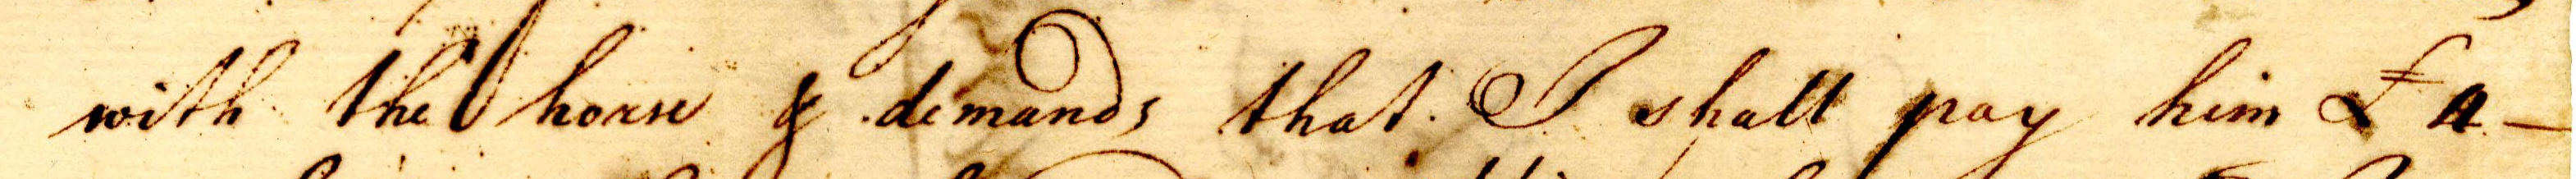with the horse & demands that I shall pay him £4
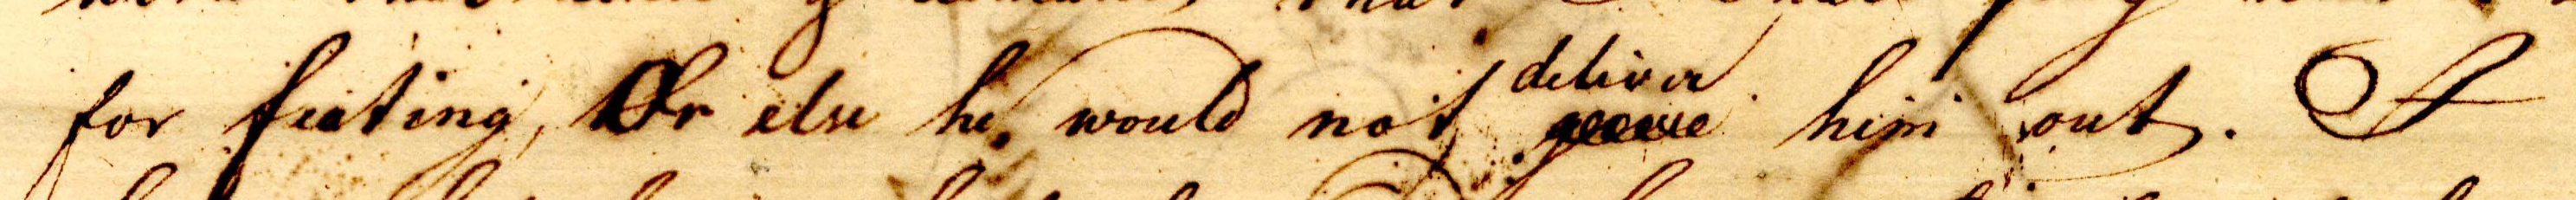for feeling, Or else would not give ^ him out. I
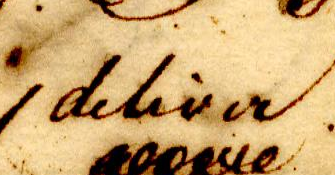deliver
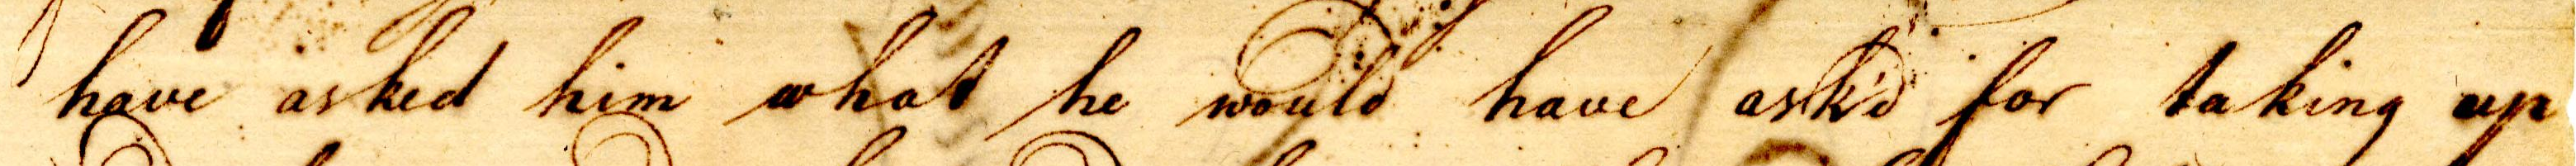have asked him what he would have ask'd for taking up
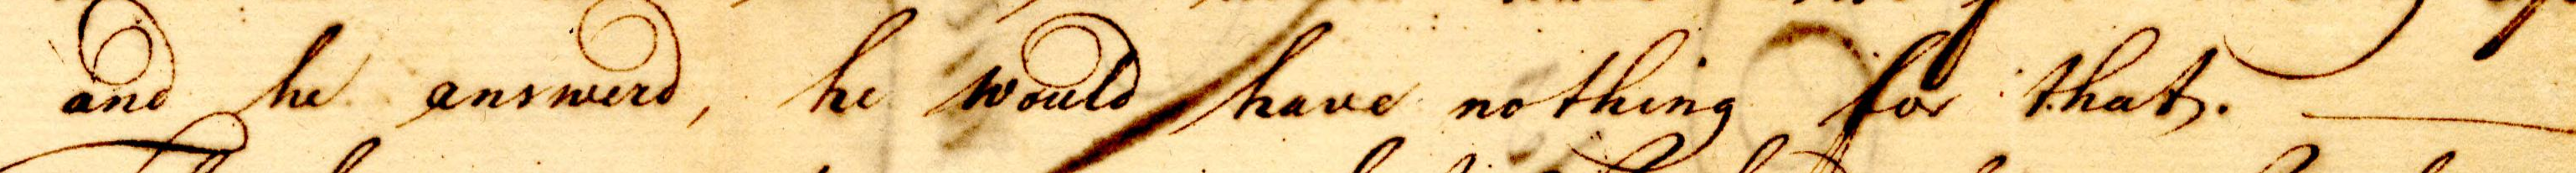and he answered, he would have nothing for that.
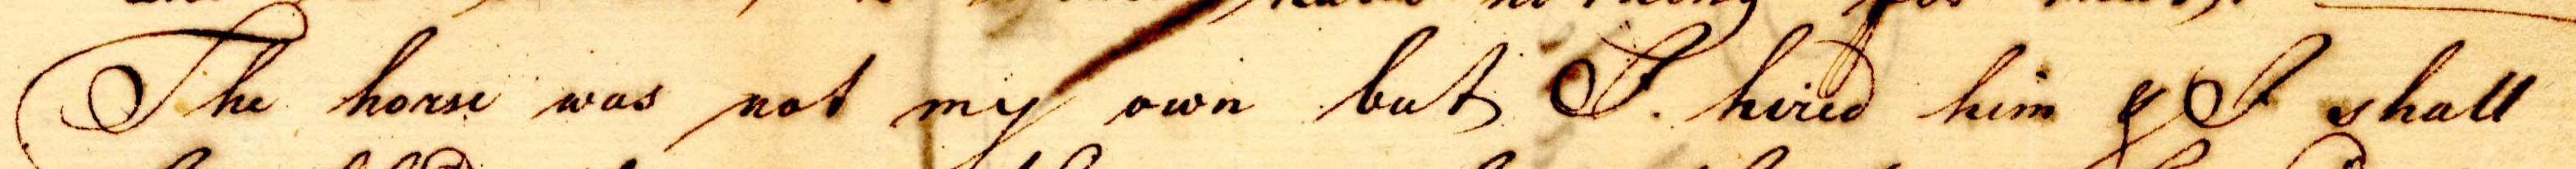The horse was not my own but I hired him & I shall
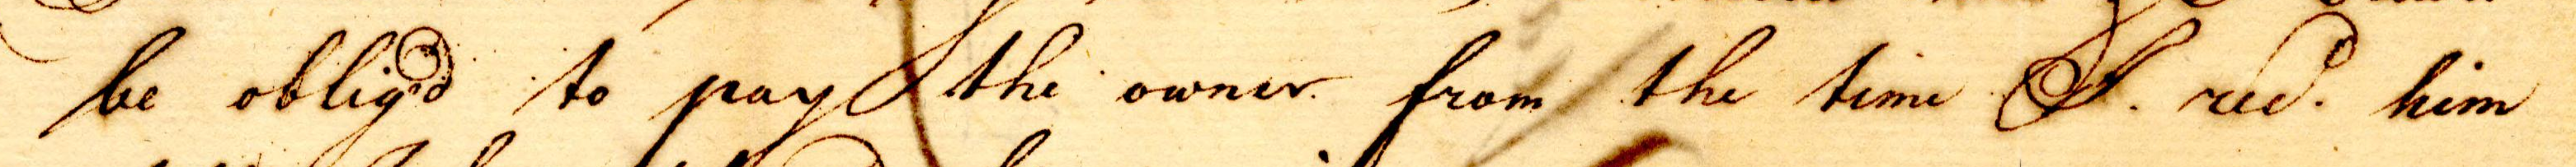be oblig'd to pay the owner, from the time I rec^d. him
